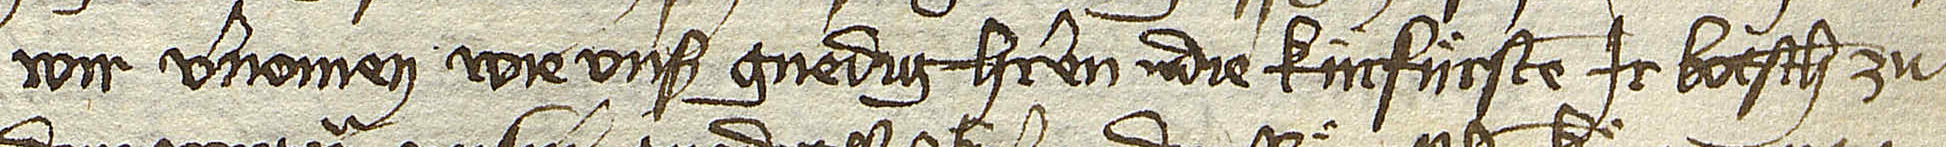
wir v*nomen wie vnſ* gnedig* h*ren ~ die kürfürſte* Ir botſch* ʒu
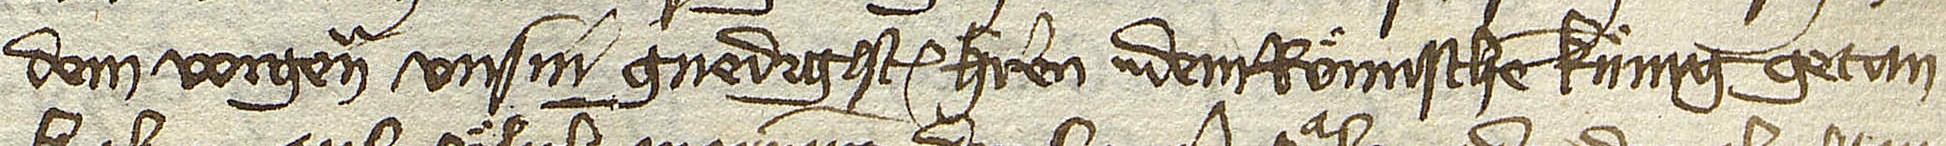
dem vorgen* vnſ*m gnedigiſt* h*ren ~ dem Römiſche* künig getan
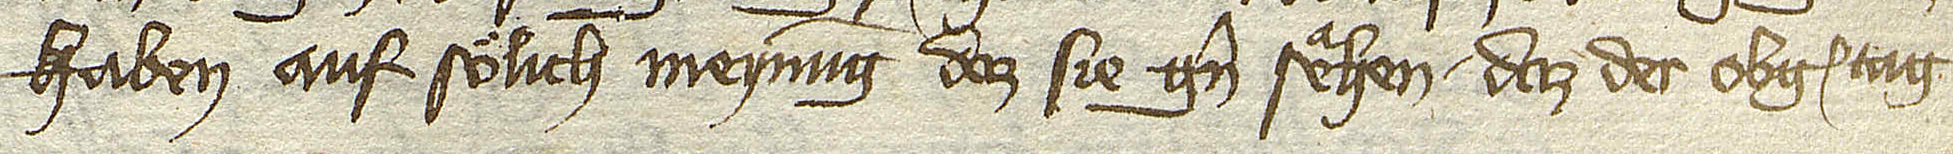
haben auf ſölich meynu*g daʒ ſie g*n ſëhen / daʒ der obg* tag
